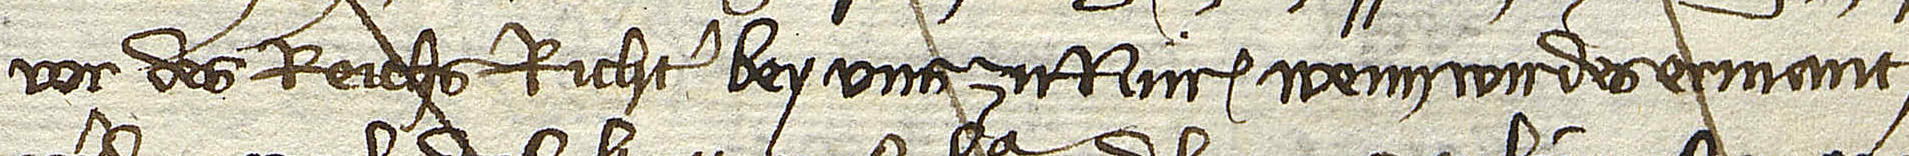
vor des Reichs Richt* bey vns ʒu Nür* wenn wir des ermant
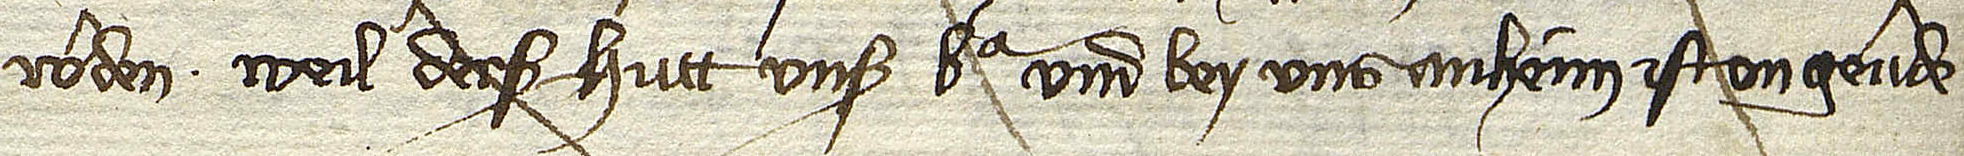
w*den . weil derſ* hutt vnſ* b* vnd bey vns anheim iſt on geu*de
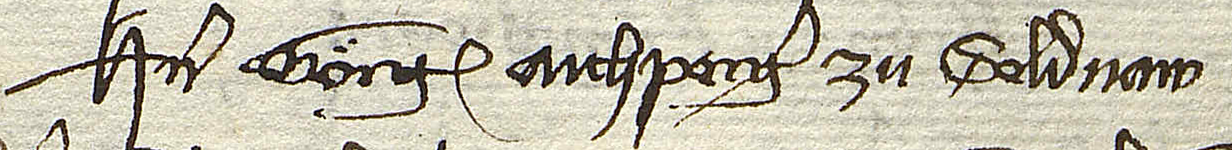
H*n Görg* aichperg* ʒu Seldnaw
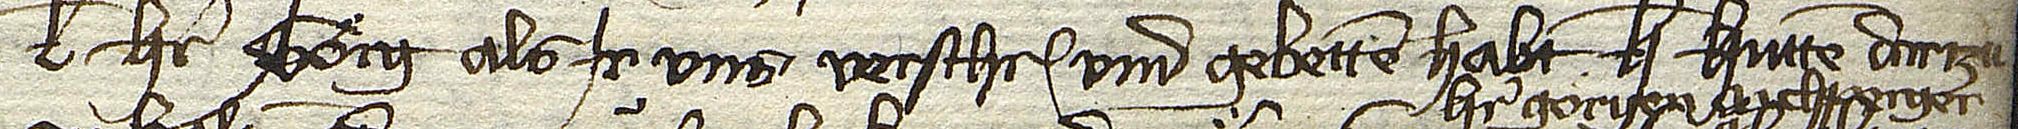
L* h*r Görg als Ir vns verſchr* vnd gebette* habt . h* hutte* darcʒu
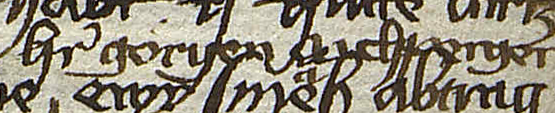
h*r görgen aichperger
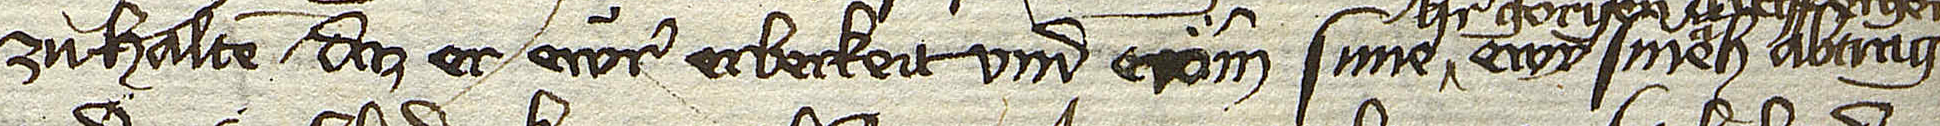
ʒu halte* / daʒ er ew*r erberkeit vnd ew*m ſune ſmëh abtrag
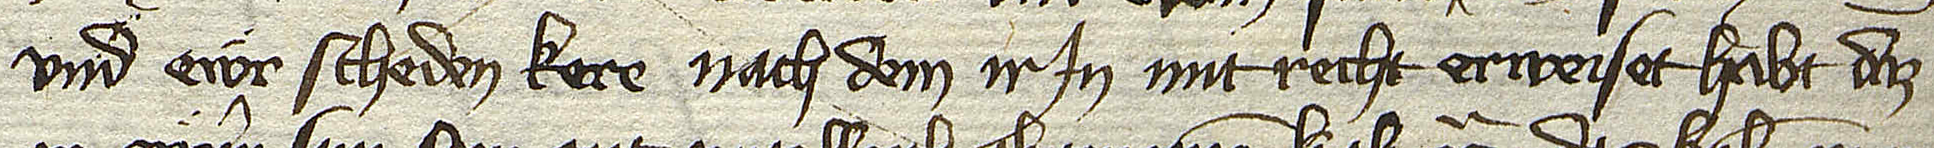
vnd ewr ſcheden kere nach dem ir In mit recht erweiſet habt daʒ
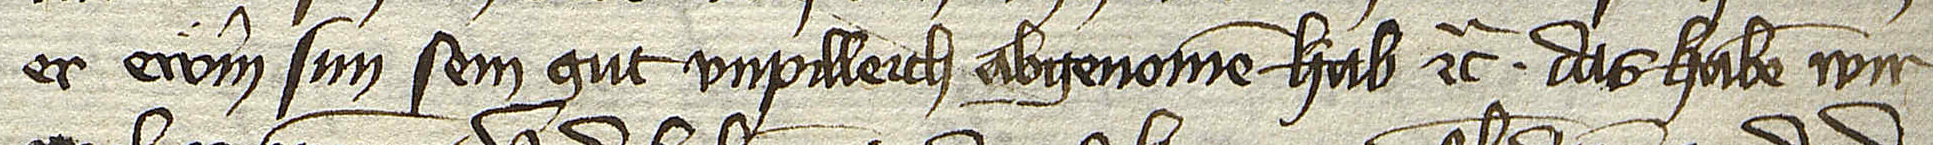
er ew*m ſun ſein gut vnpilleich abgenome* hab ec* . das habe* wir
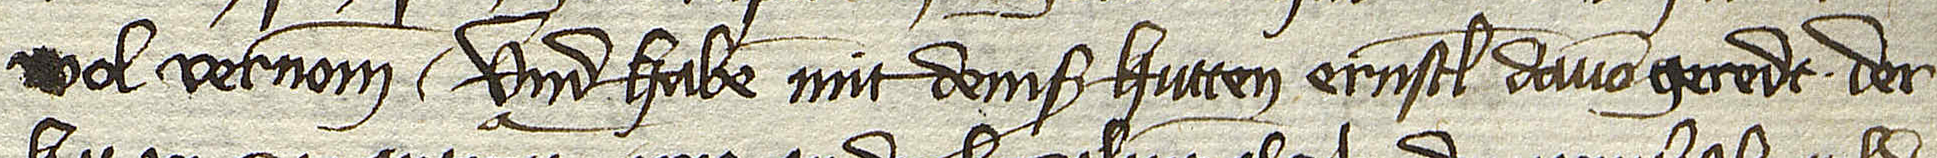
wol vernom* / Vnd habe* mit demſ* hutten ernſtl* dauo* geredt . der
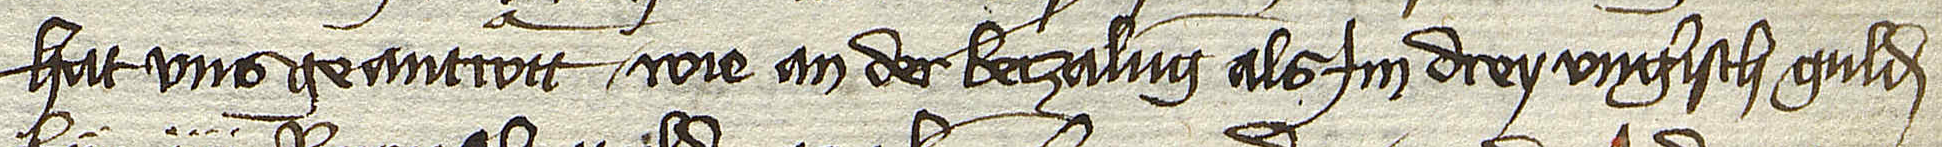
hat vns geantw*tt / wie an der becʒalu*g als Im drey vng*iſch guld*
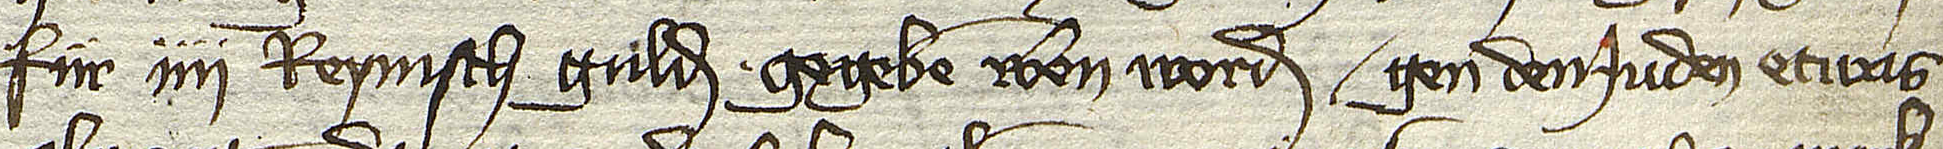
für iiii Reyniſch guld* . gegebe* we*n word* / gen den Iuden etwas
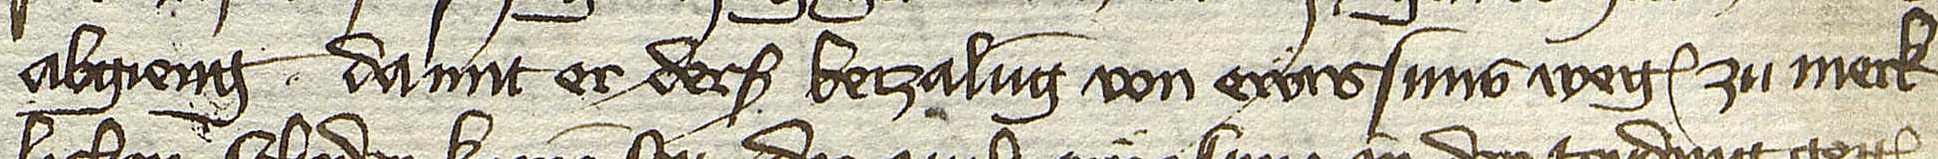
abgieng . damit er derſ* becʒalu*g von ewrs ſuns weg* ʒu merk
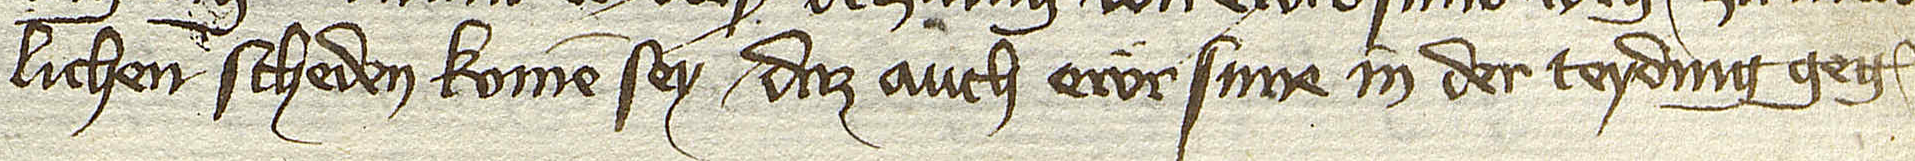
lichen ſcheden kome* ſey / daʒ auch ewr ſune in der teyding geg*
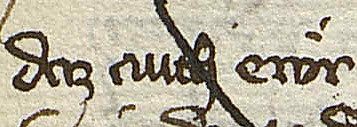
daʒ auch ewr
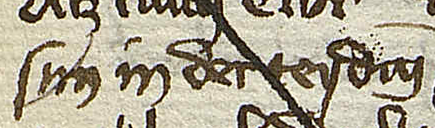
ſun in der teydig*
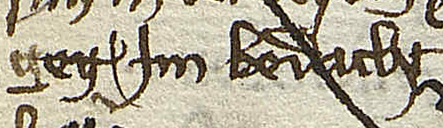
geg* Im bedacht
